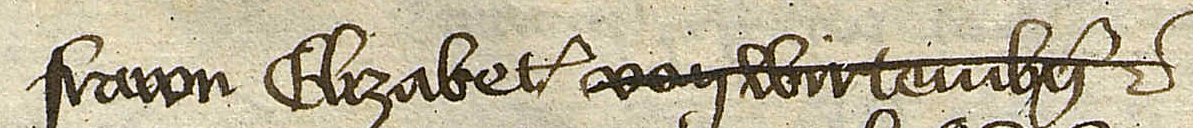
frawn Eliʒabet* von Wirtembg* ec*
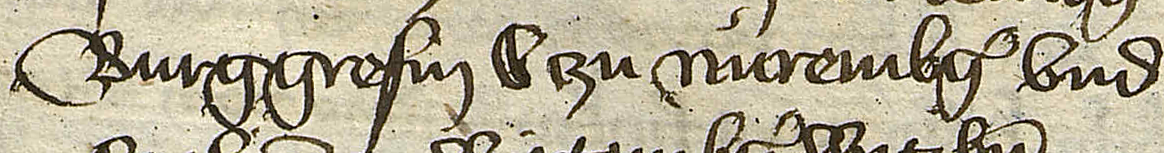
Burggrefin b ʒu nürembg* vnd
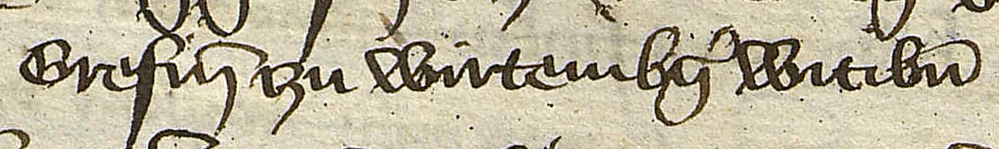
Grefin* ʒu Wirtembg* Witibn*
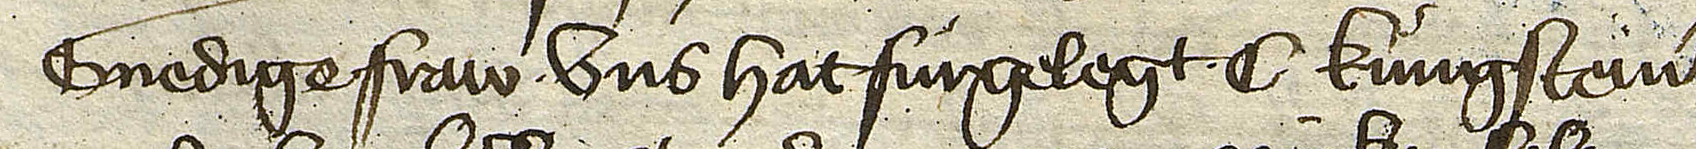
Gnedige frau . Vns hat fürgelegt . C küngſtein*
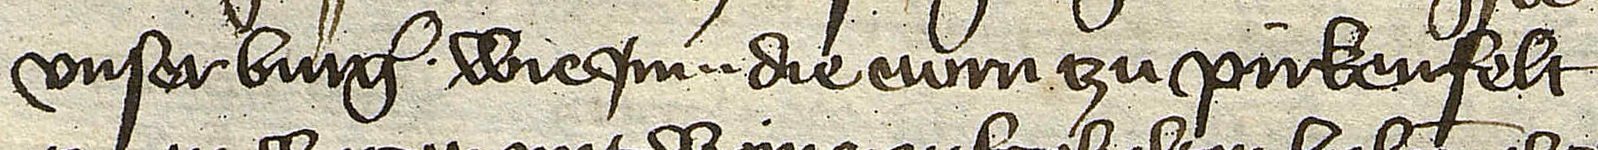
vnſer burg* . Wie Im ~ die ewrn ʒu pirkenfelt
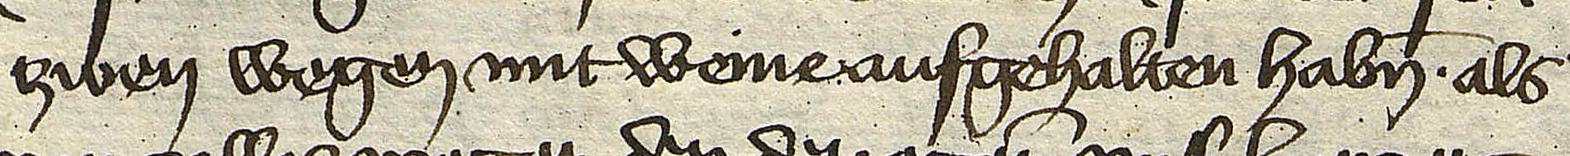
ʒwen wegen mit weine aufgehalten hab*n . als
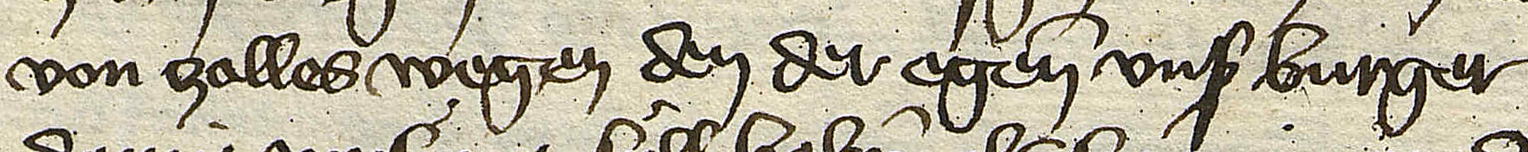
von ʒolles wegen den der egen* vnſ* burger
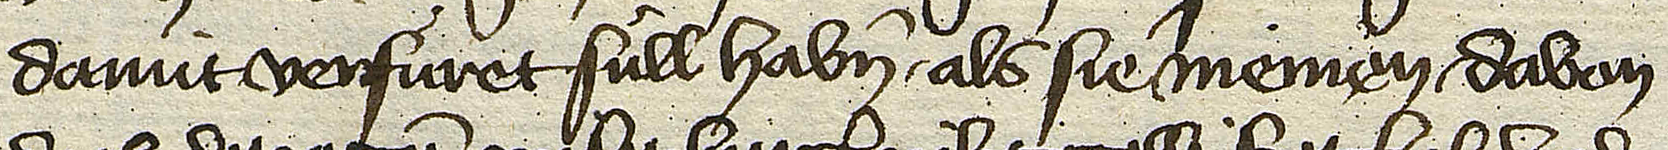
damit verfüret . ſüll habn* / als ſie meinen / davon
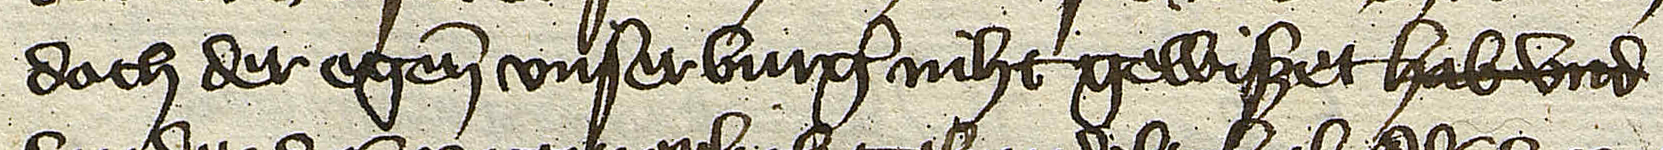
doch der egen* vnſer burg* niht gewiſʒet hab vnd
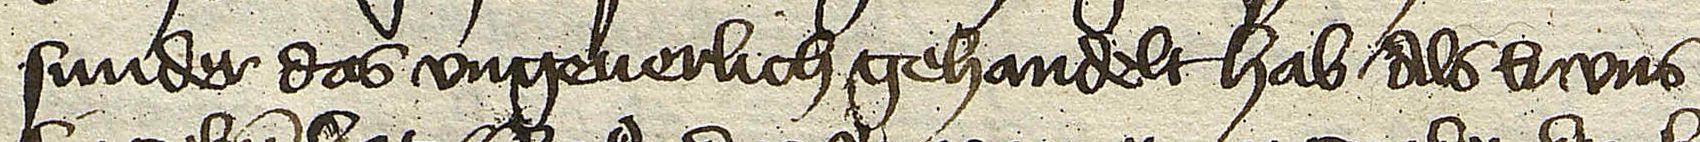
ſunder das vngeuerlich gehandelt hab / Als Er vns
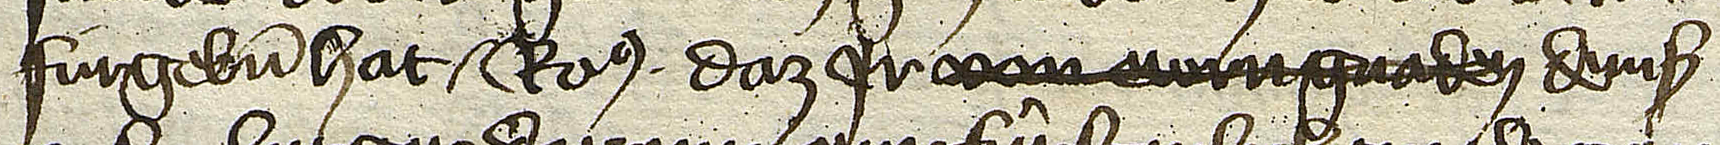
fürgebn* hat / Ro* . daʒ Ir von ewrn gnaden demſ*
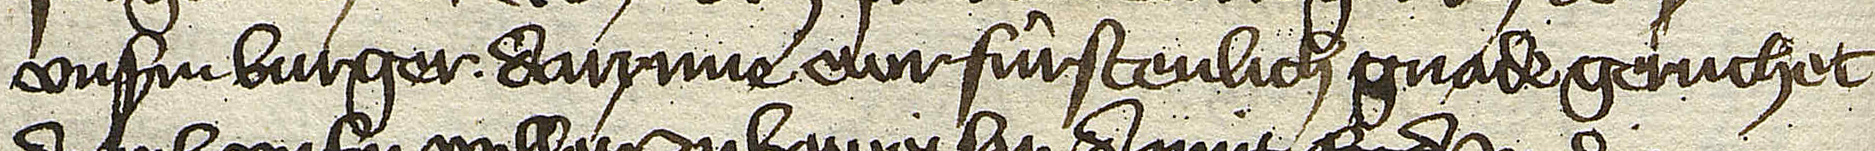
vnſ*m burger . darynne ewr fürſtenlich gnade geruchet
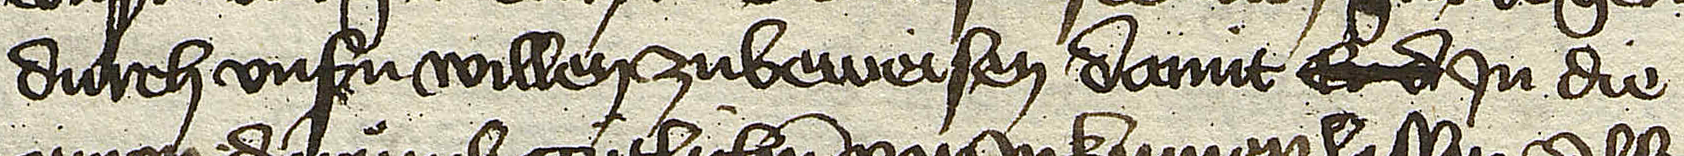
durch vnſ*n willen ʒubeweiſen damit Er d In die
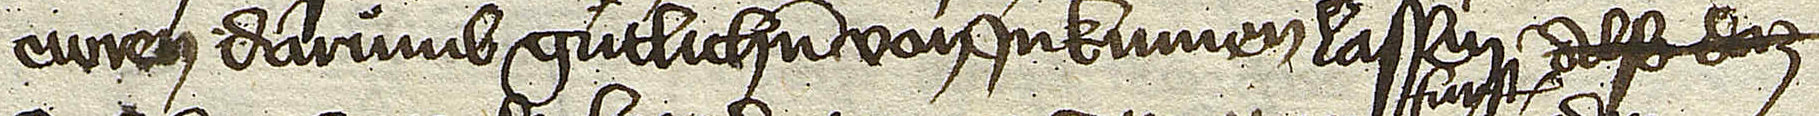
ewren darümb gütlichn* von In kumen laſſen Alſo daʒ
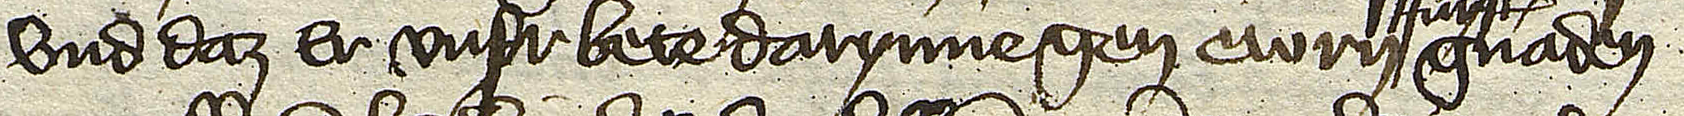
vnd daʒ Er vnſ*r bete darynne gen ewrn gnaden
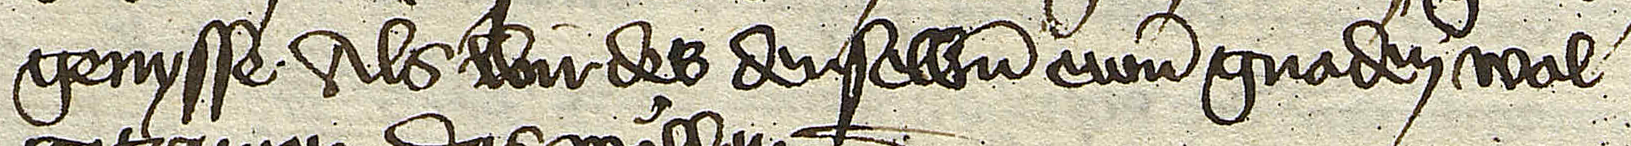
genyſſe . Als wir des denſelbn* ewn* gnaden wol
